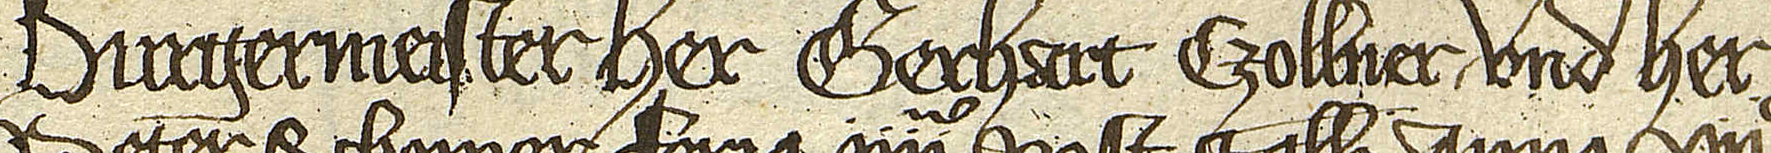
Burgermeiſter Her Gerhart Cʒollner / Vnd Her
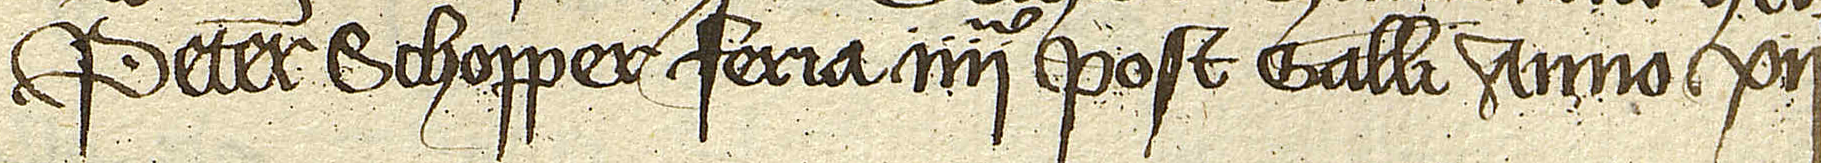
Peter Schopper feria iiii* poſt Galli Anno xii*
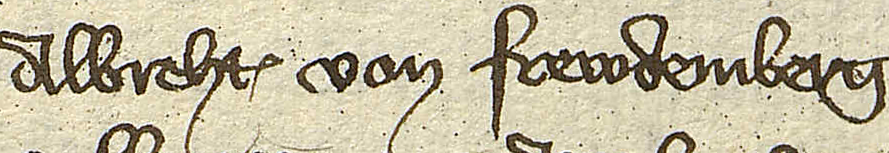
Albreht* von frewdemberg
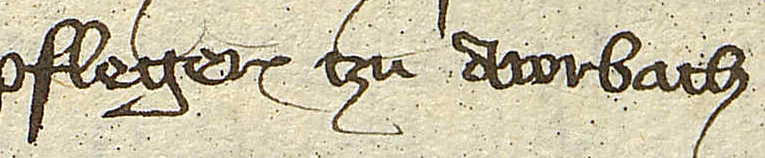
Pfleger cʒu Awrbach
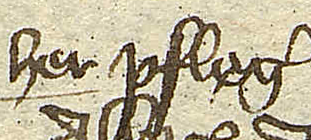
her pfleg*
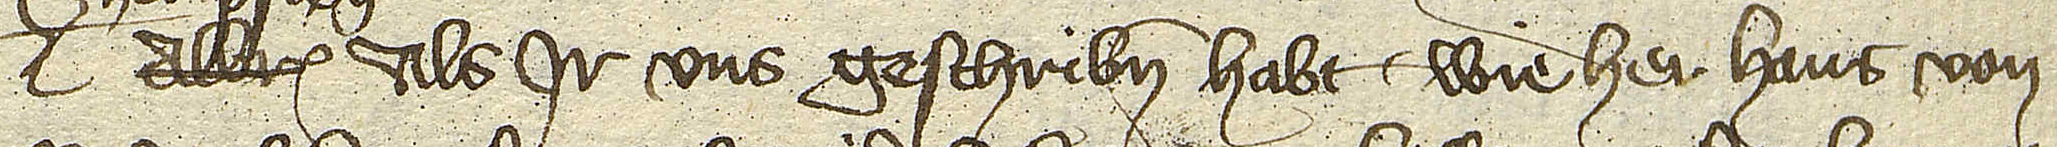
L* Albr* Als Ir vns geſchribn* habt / wie her hans von
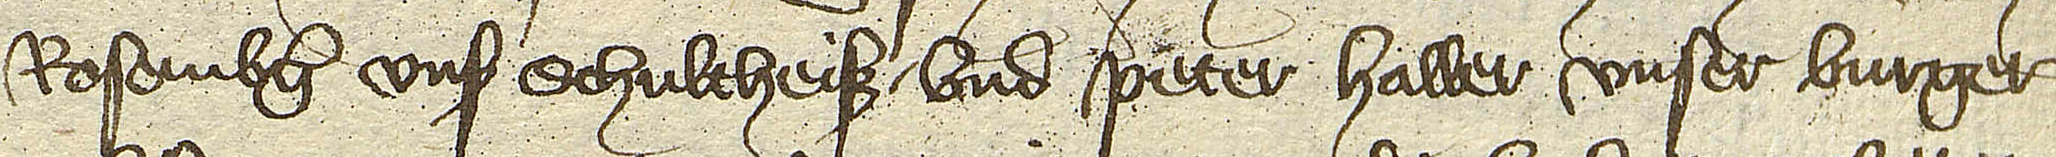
Roſembg* vnſ* Schultheiſʒ / vnd Peter haller vnſer burger
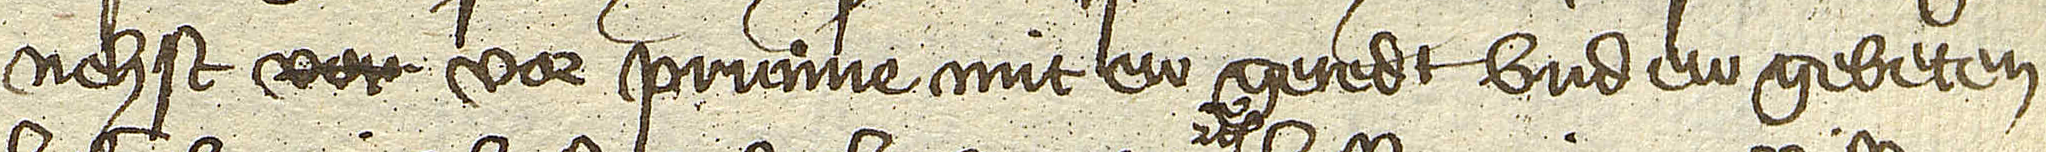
nehſt vor vor Prunne mit ew geredt vnd ew gebeten
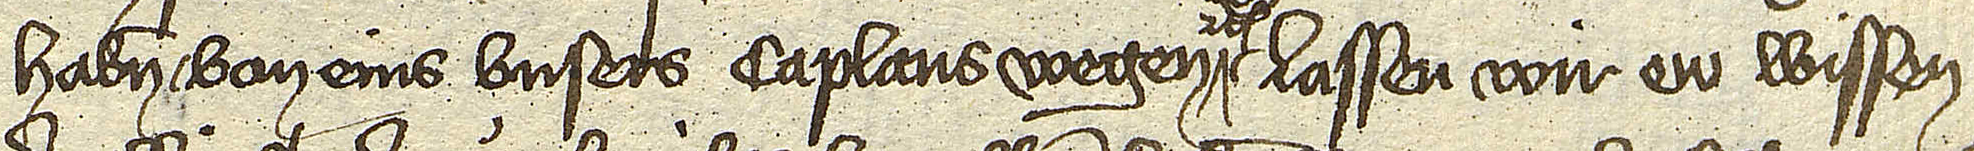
habn* / von eins vnſers Caplans wegen / laſſen wir ew wiſſen
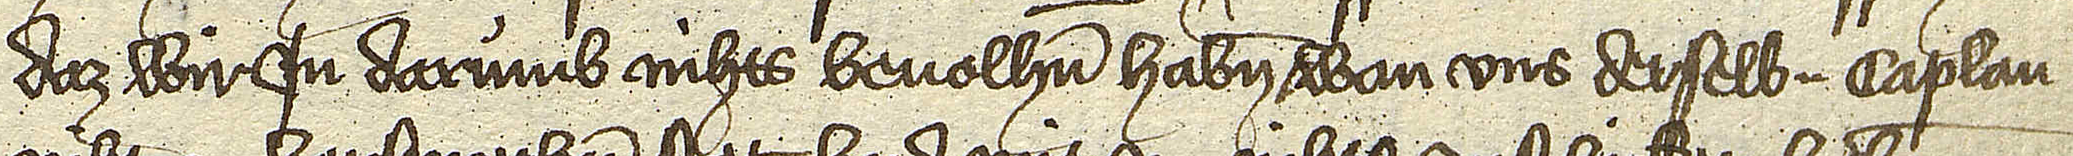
daʒ wir In darümb nihts beuolhn* habn* / wan vns derſelb ~ Caplan
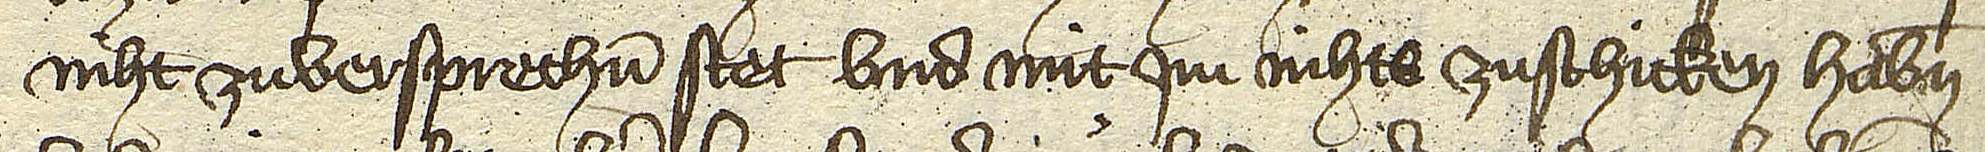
niht cʒuverſprechn* ſtet vnd mit Im nihts cʒuſchicken habn*
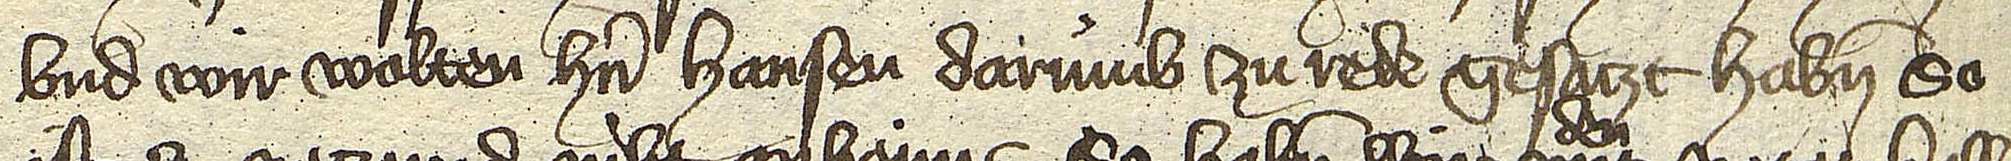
vnd wir wolten hn* Hanſen darümb cʒu rede geſacʒt habn* So
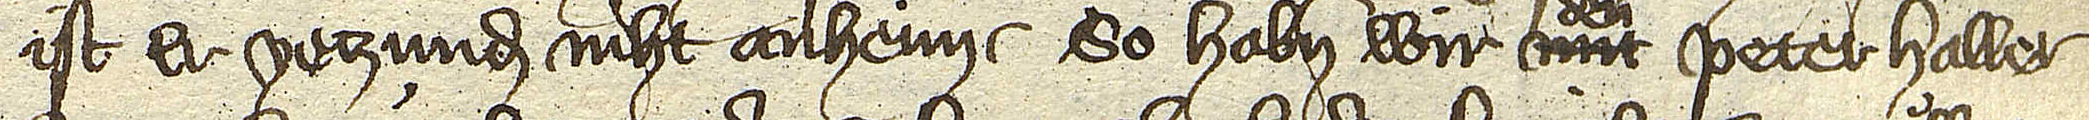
iſt Er yecʒund* niht anheim / So habn* wir mit Peter haller
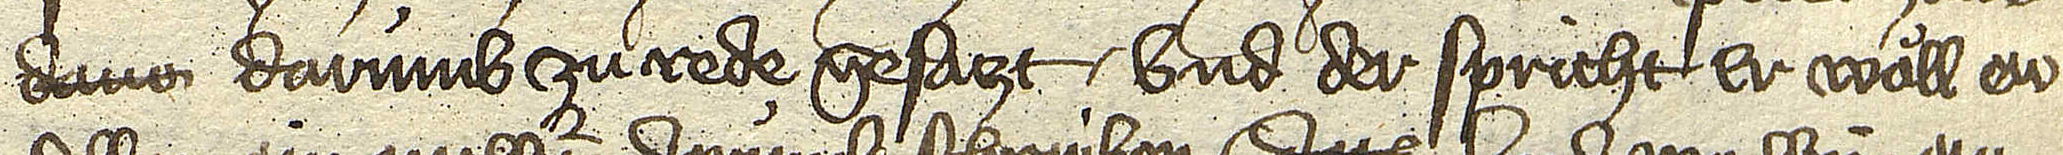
dauo darümb cʒu rede geſacʒt / vnd der ſpricht Er wöll ew
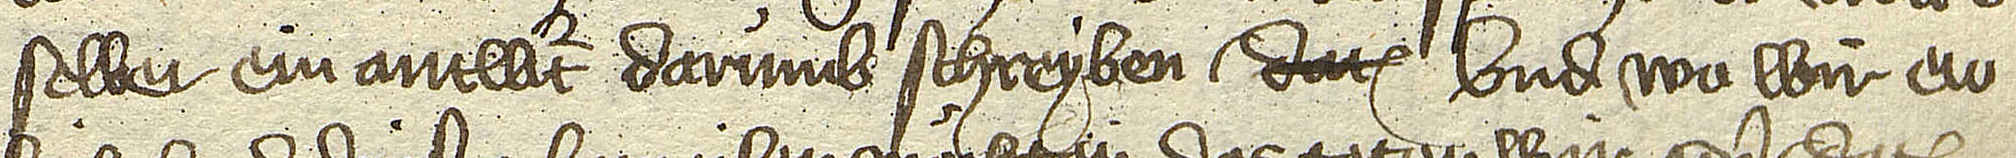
ſelber ein antw*t darümb ſchreyben / dat* vnd wo wir ew
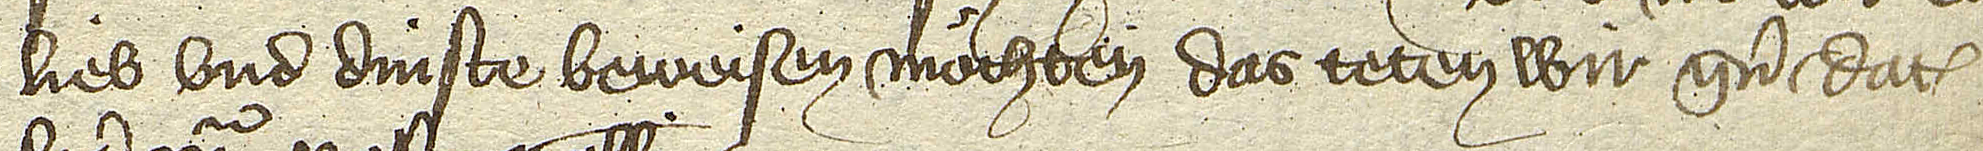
lieb vnd dinſte beweiſen möchten das teten wir gn* / dat*
